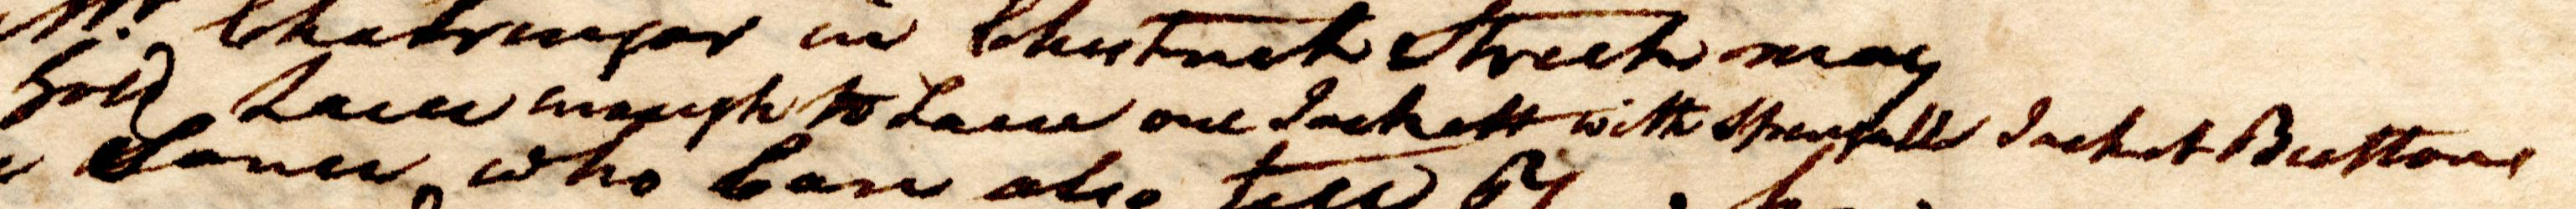said Leave myself to leave one Packett with Stovealld jacket Buttons
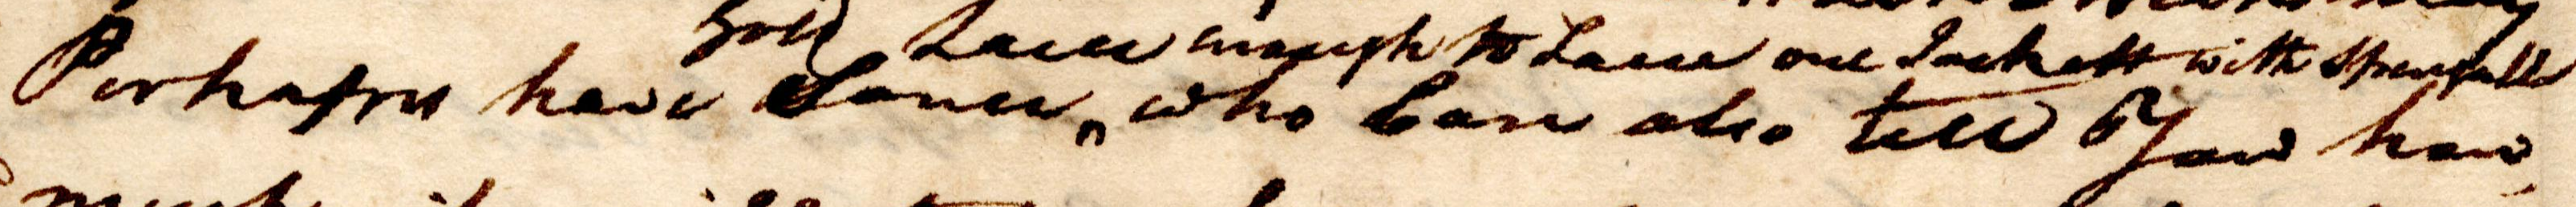perhaps have some ^ who Can also tell you how
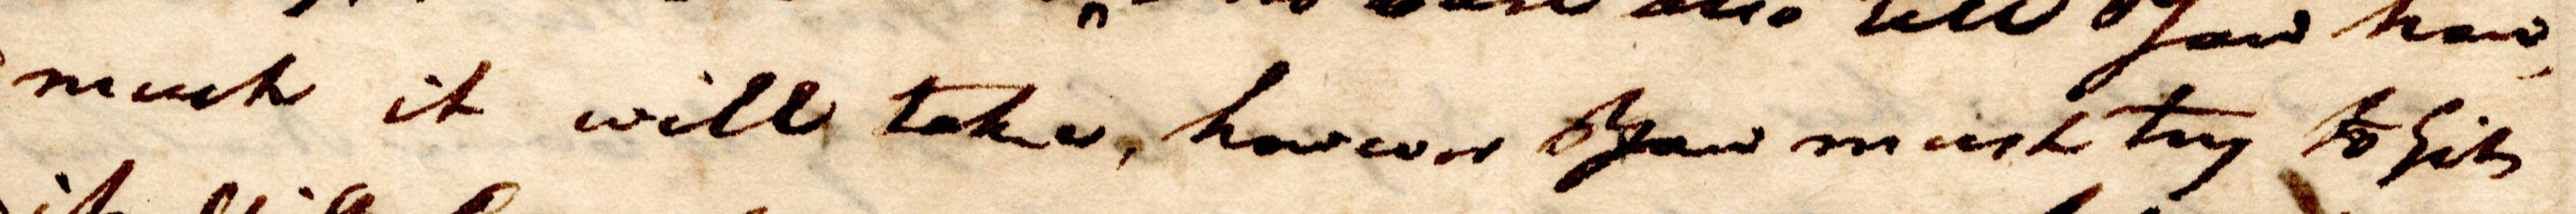much it will take, however you must try to git,
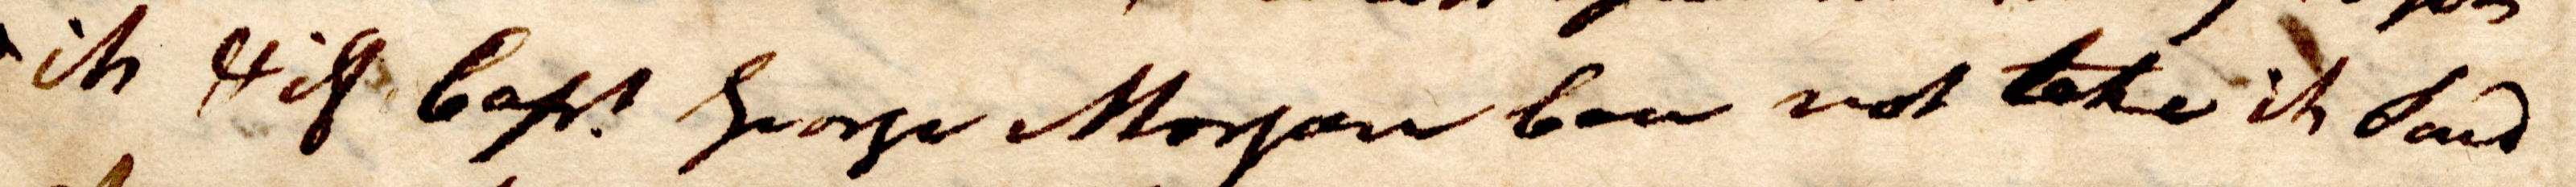it & if Cap^t George Morgan can not take it Send
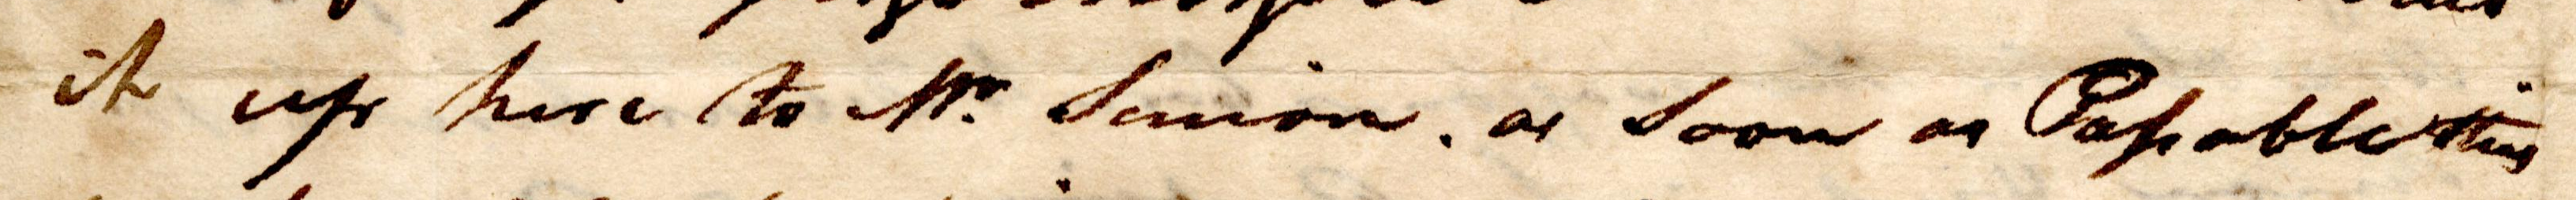it up here to M^r Simon, as soon as Possable this
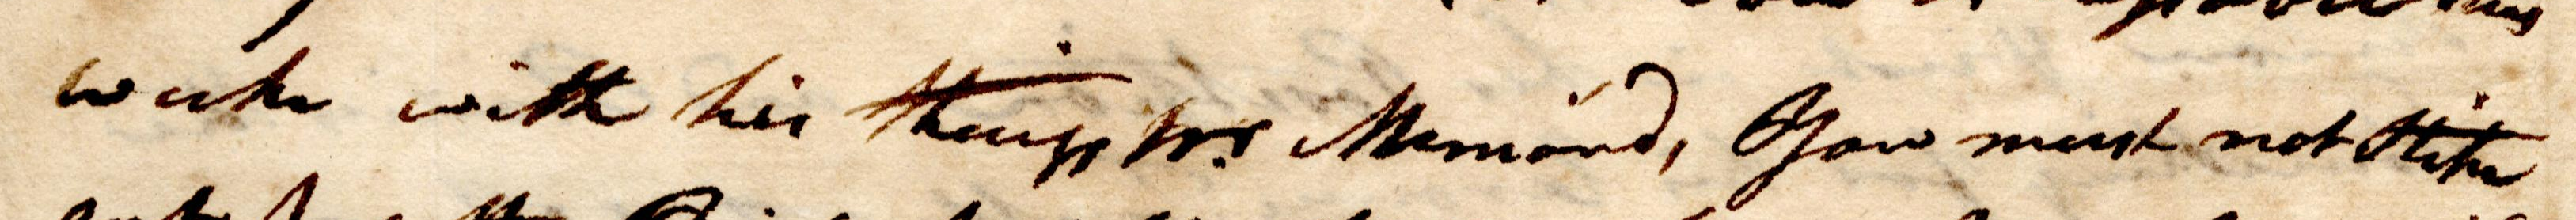weeke with his things M^r Memond, you must not take
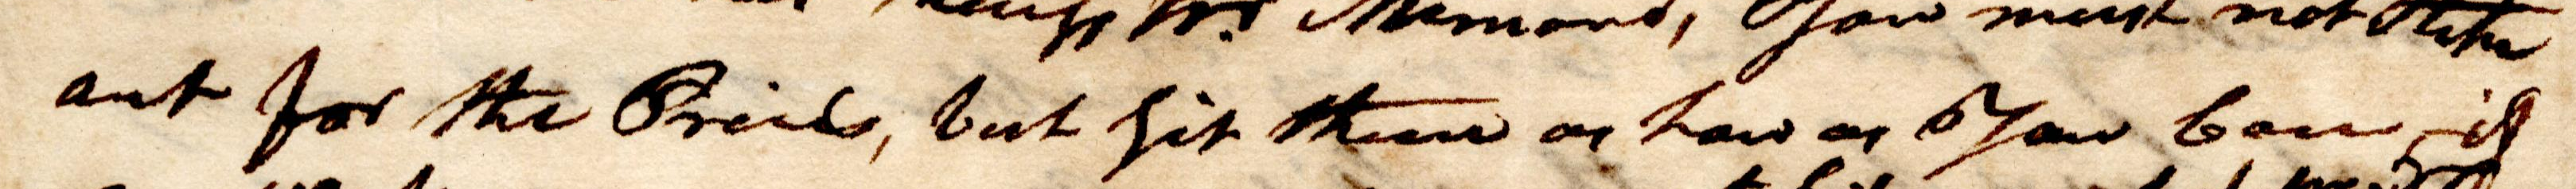ant for the Prices, but git them as low as you Can if
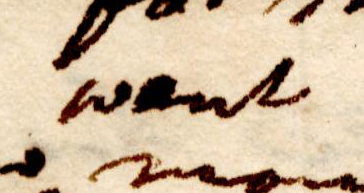want
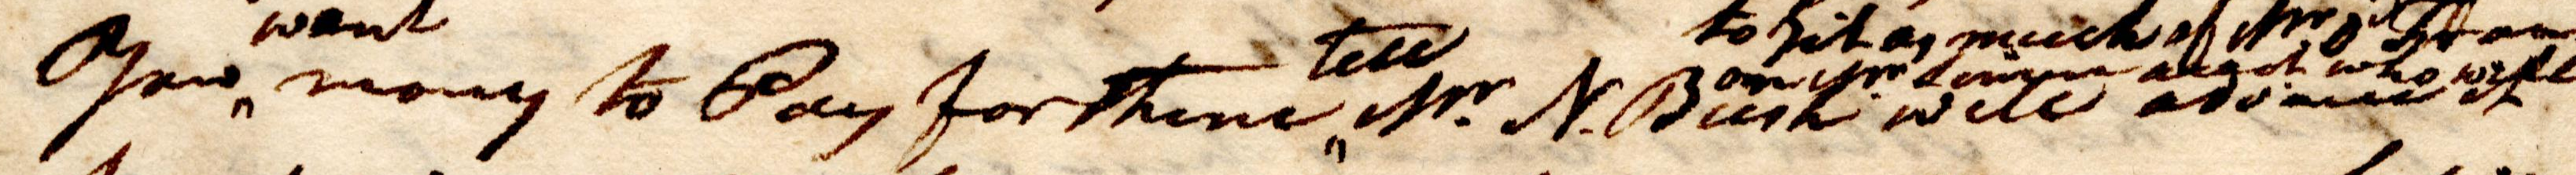You ^ money to Pay for them ^ M^r N. Bush will advance it
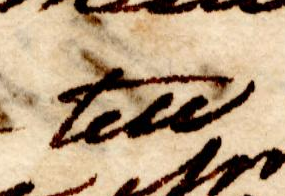tell
